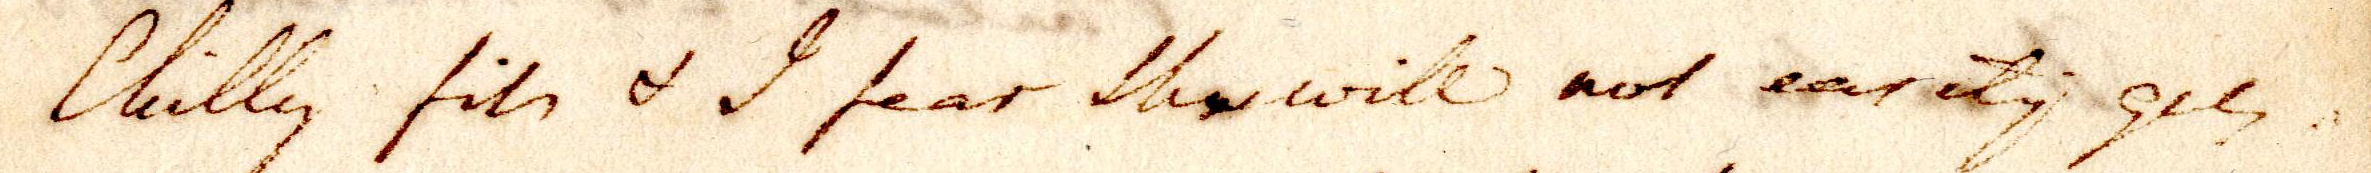Chilly fits & I fear she will not easily get
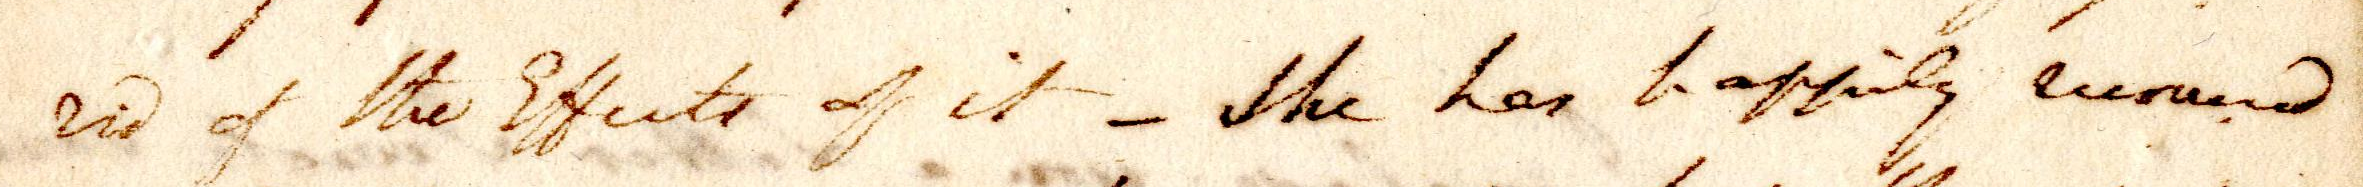rid of the Effects of it. she has happily recovered
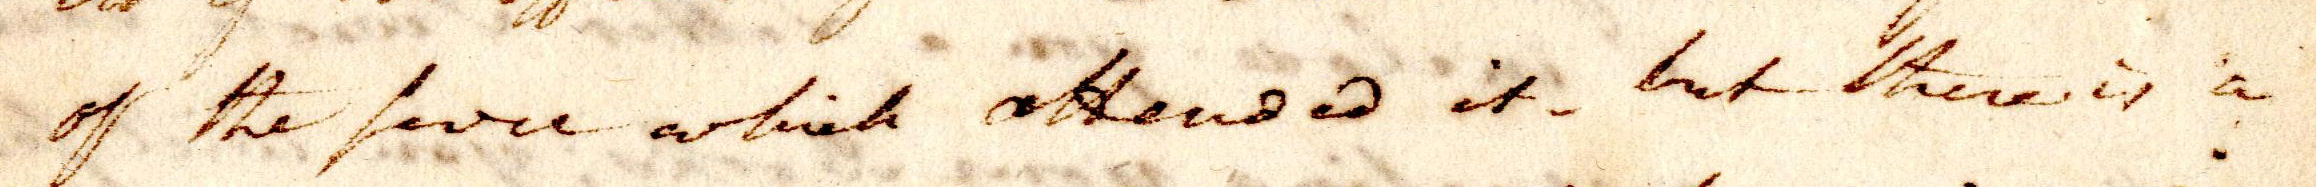of the fever which attended it but there is a
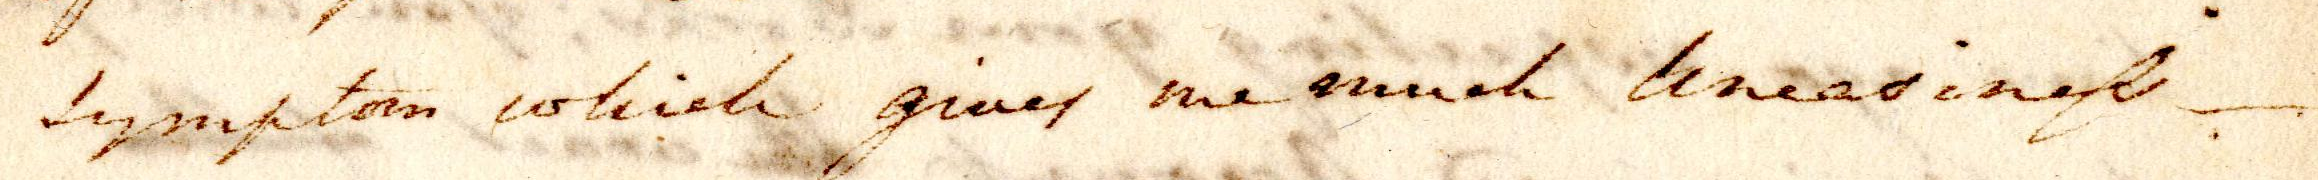symptom which gives me much Uneasiness
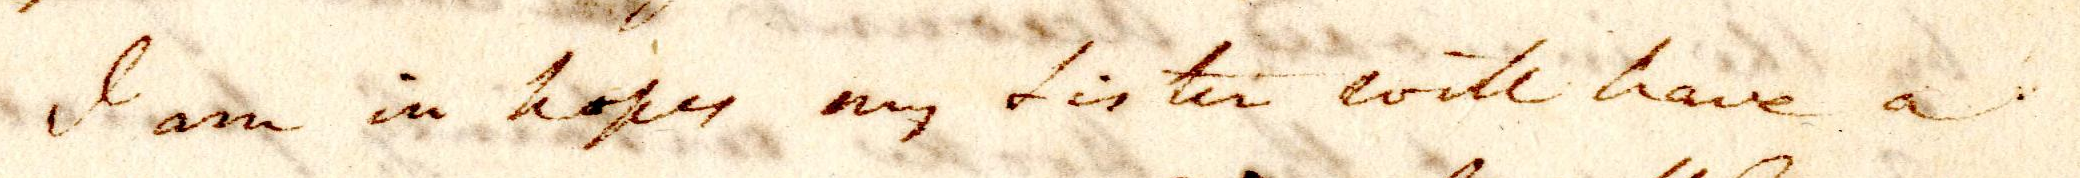I am in hopes my Sister will have a
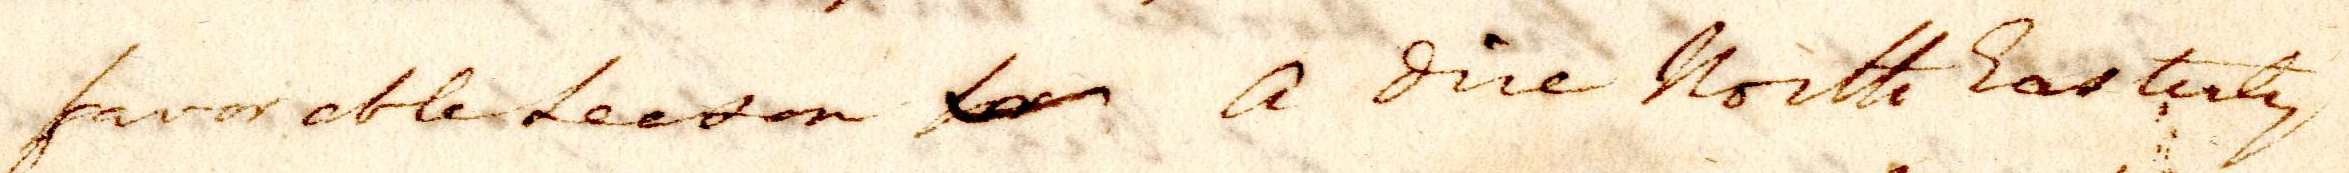favorable Season for a dire North Easterly
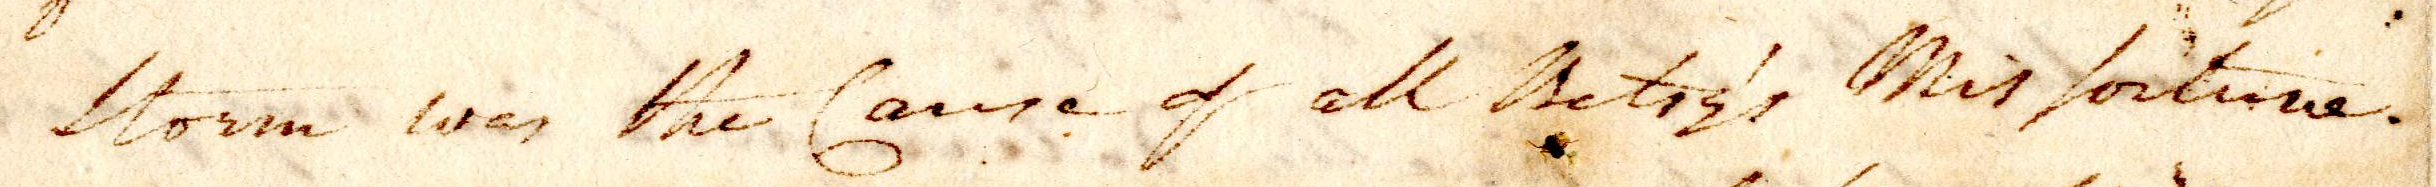Storm was the Cause of all Betsy's Misfortune.
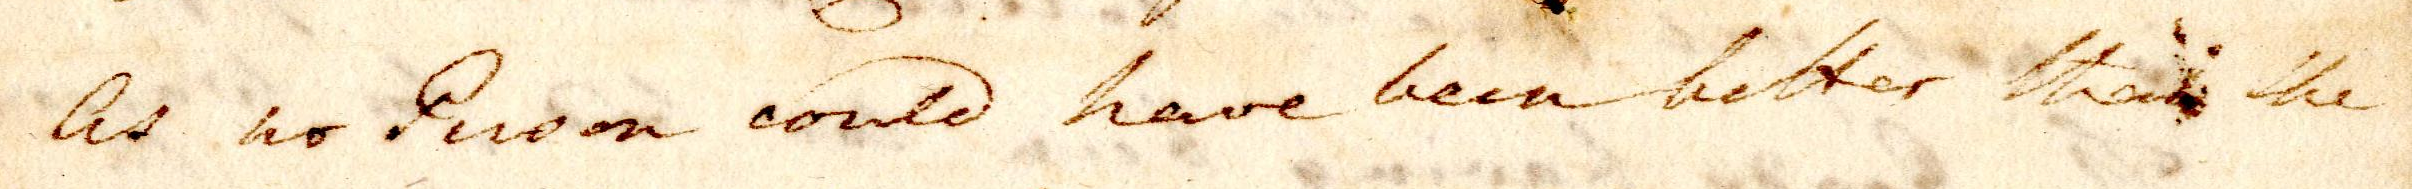As no Prison could have been better than she
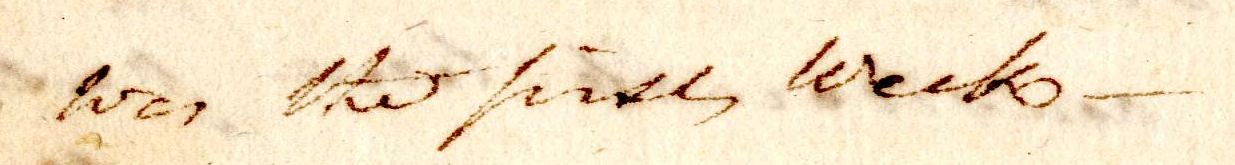was the first week.
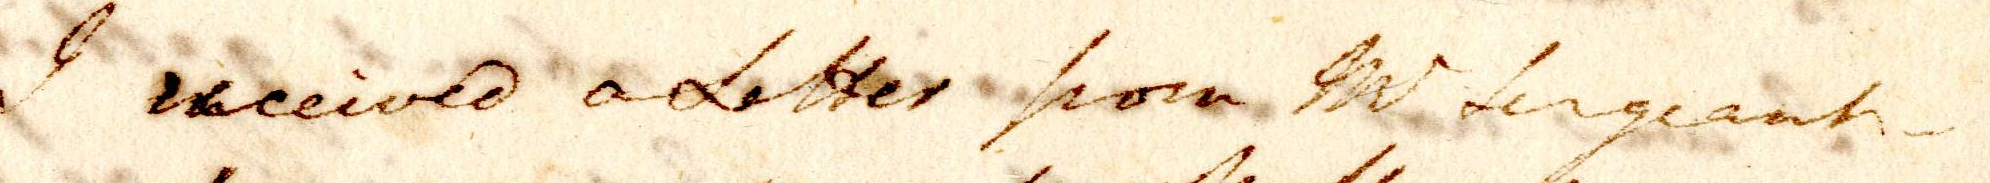I received a Letter from M^r Sergeant
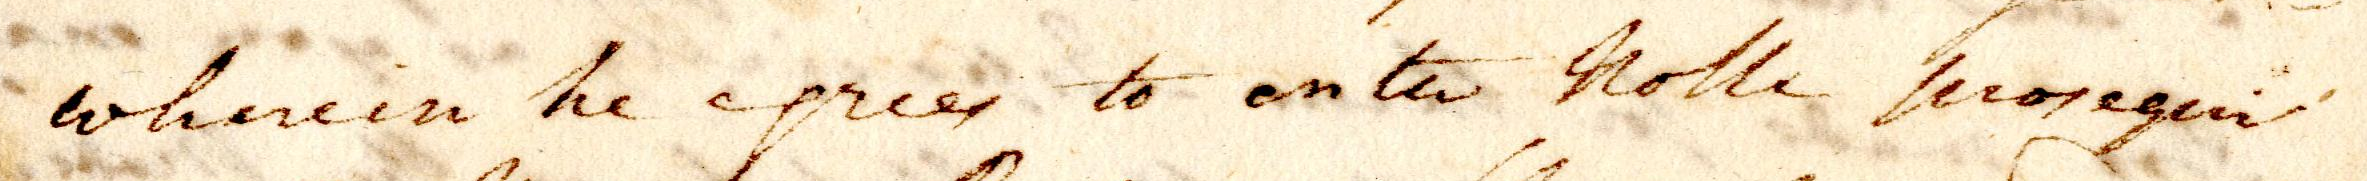wherein he agrees to enter North Prosegen
